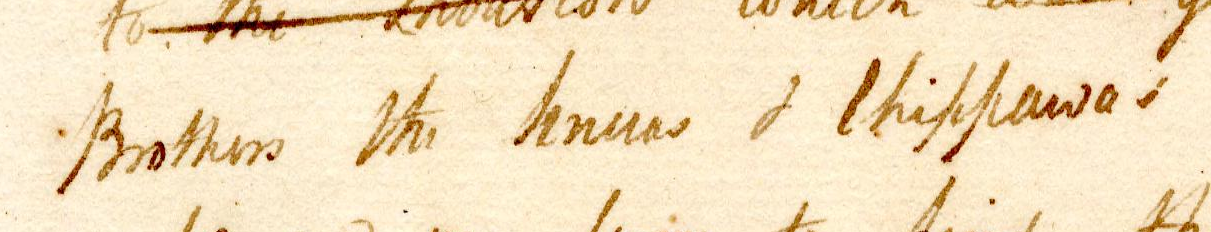Brothers the Senecas & Chippawas
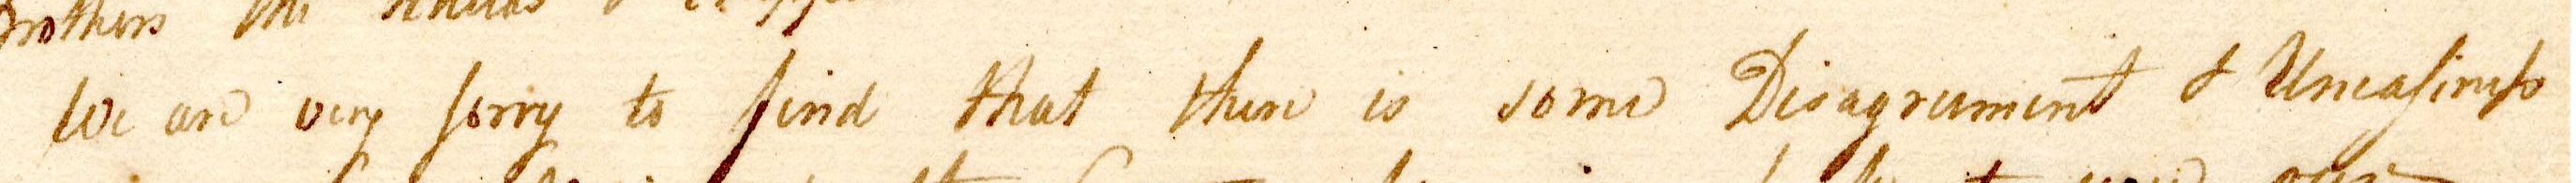We are very sorry to find that there is some Disagreement & Uneasiness
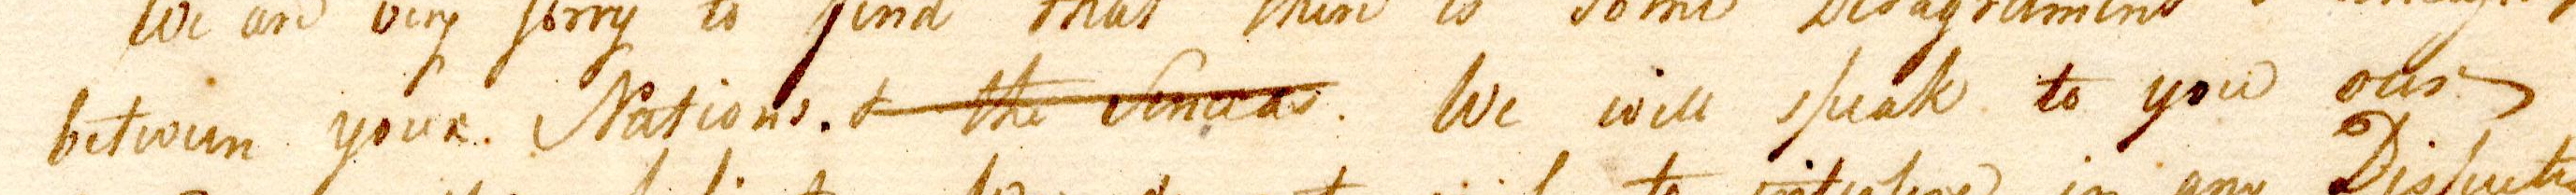between your Nations [& the Senecas]. We will speak to you our
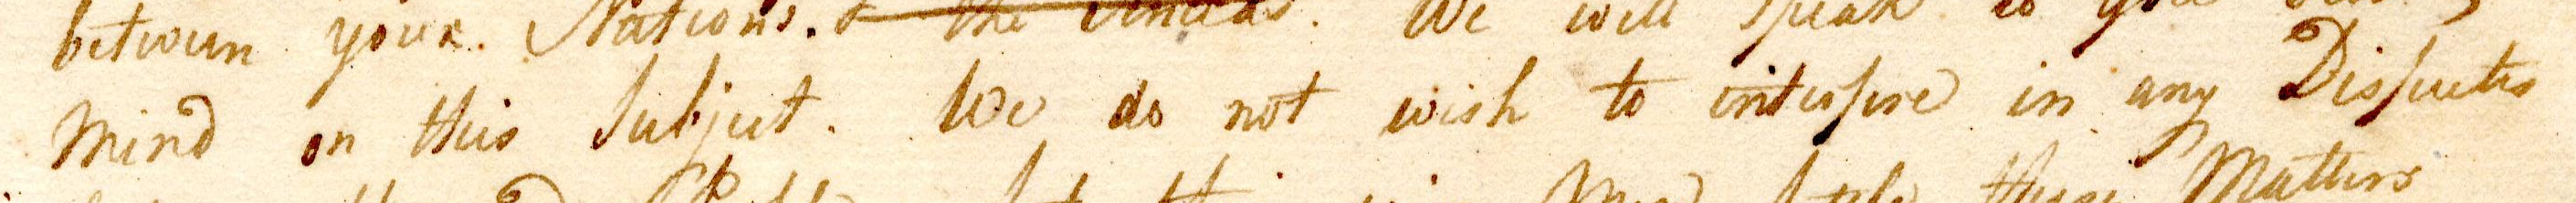Mind on this Subject. We do not wish to interfere in any Disputes
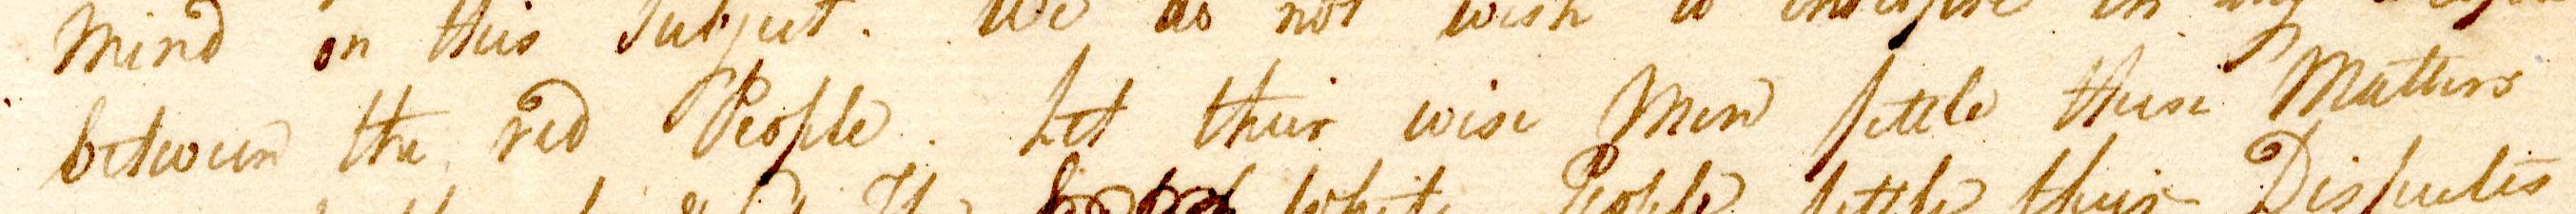between the red People. Let their wise men settle these Matters
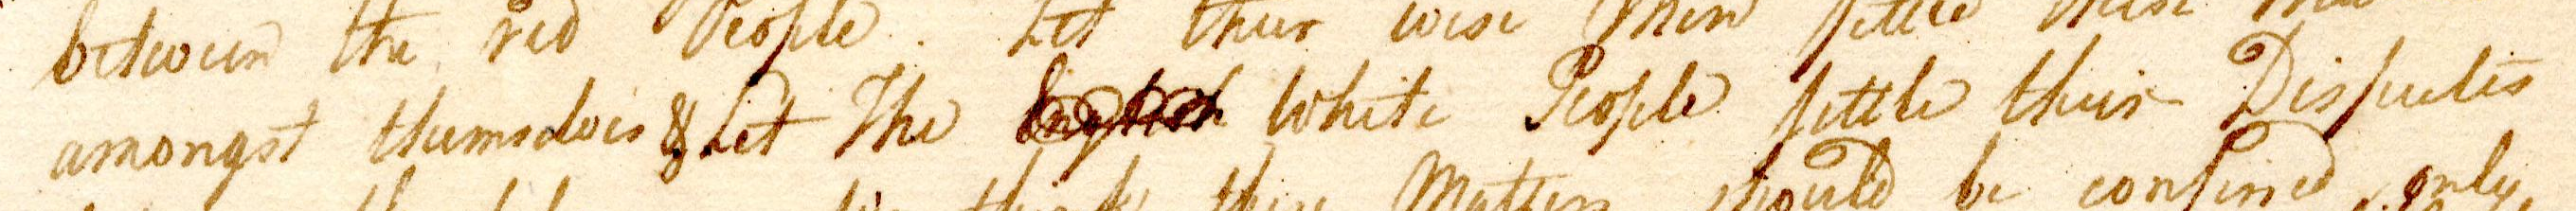amongst themselves & Let the [English] white People Settle their Disputes
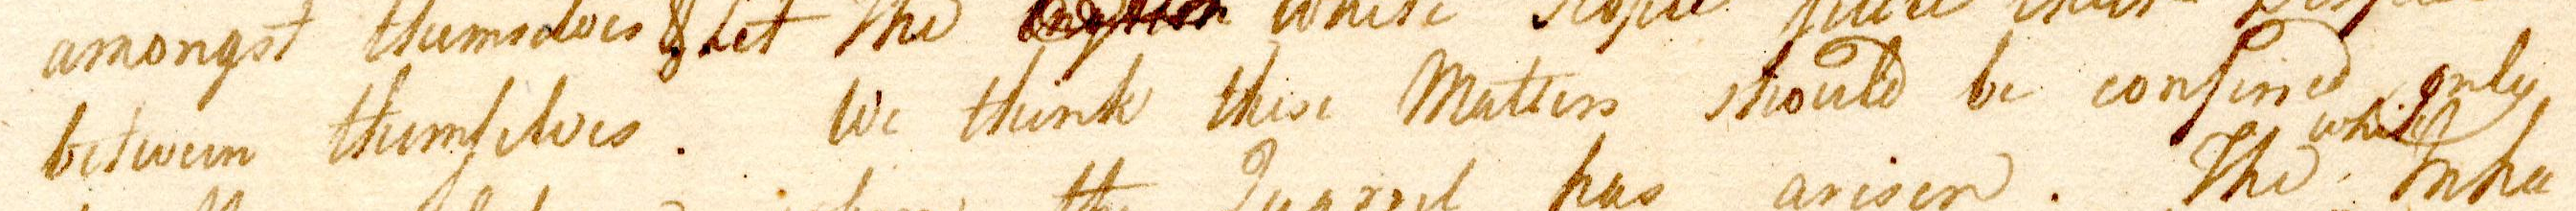between themselves. We think these Matters should be confin'd only
